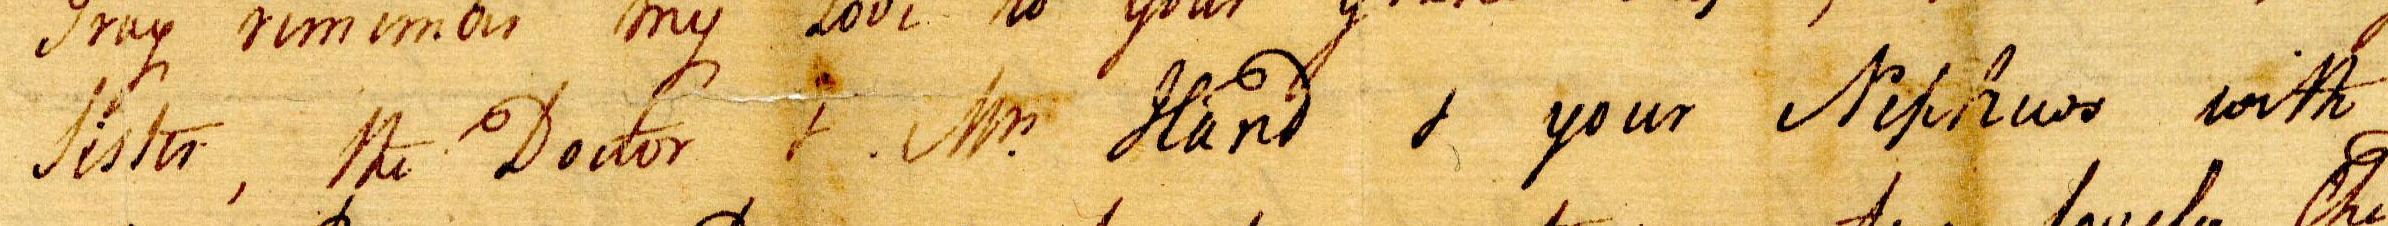Sister, the Doctor & M^r. Hand & your Nephews with
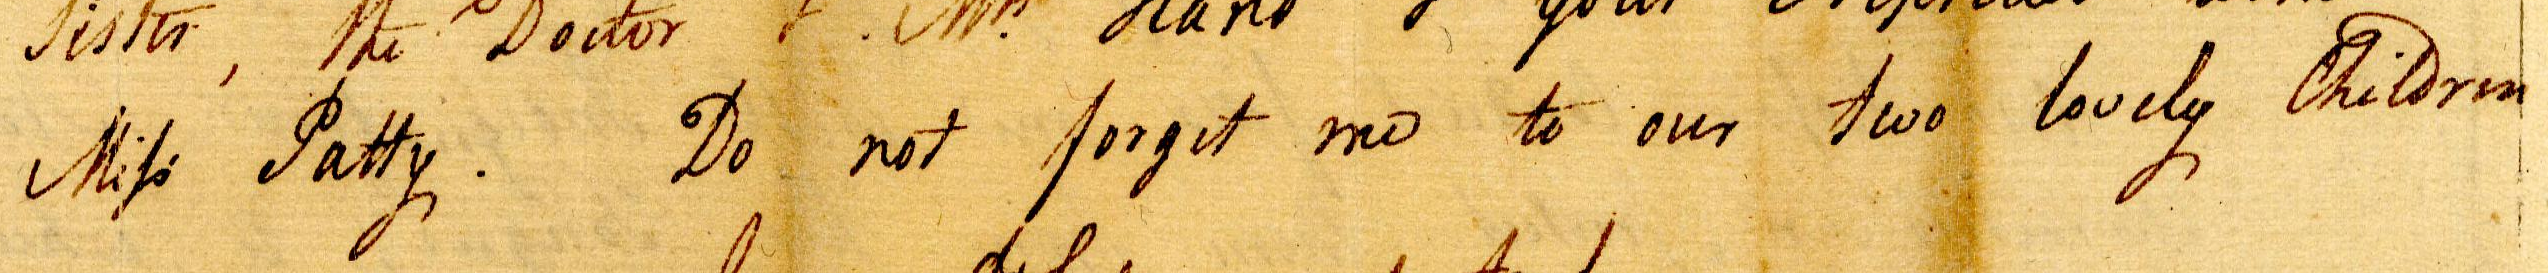Miss Patty. Do not forget me to our two lovely Children
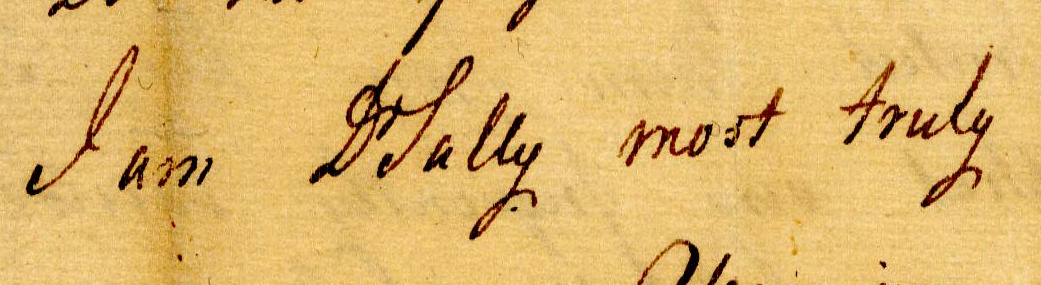I am D^r Sally most truly
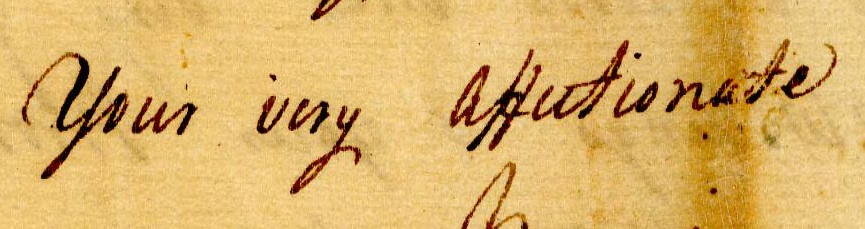Your very affectionate
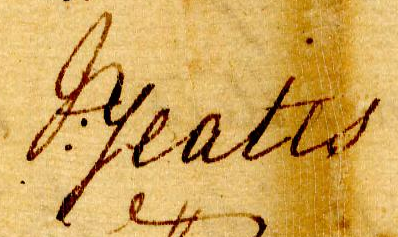J. Yeates
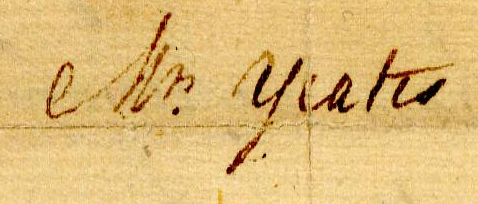M^r. Yeates
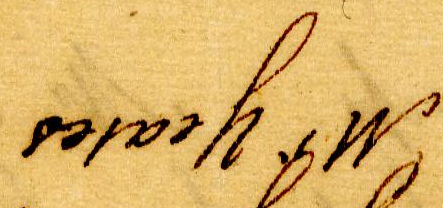M^r. Yeates
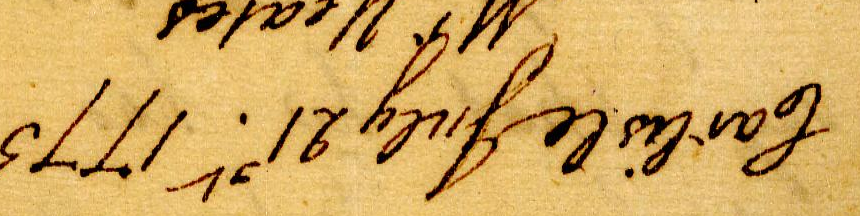Carlisle July 21^st. 1775
